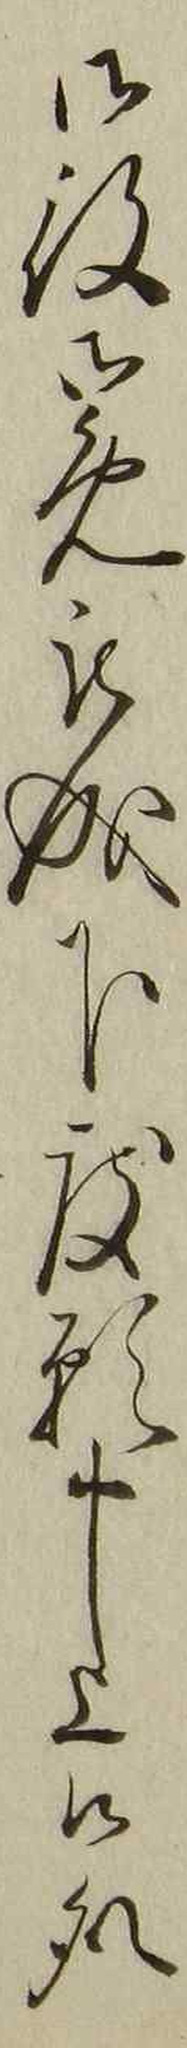御役御免被成下度願申上候処
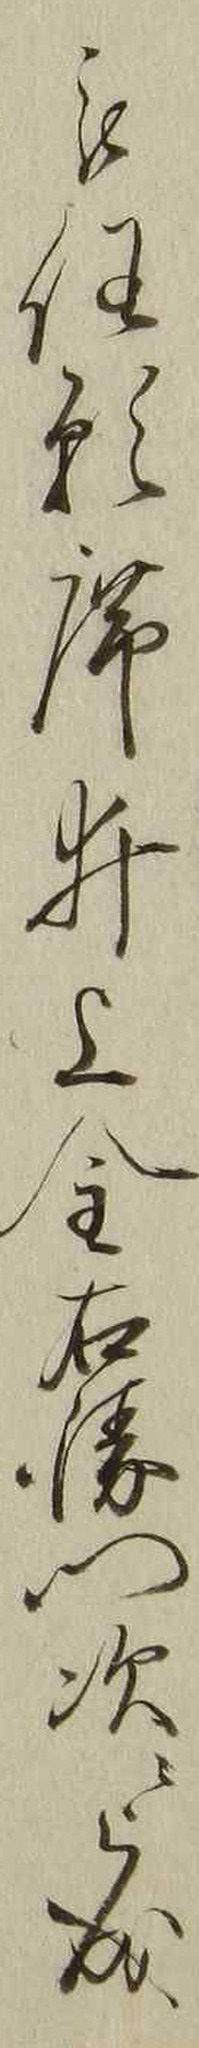被任願席井上金右衛門次に被成
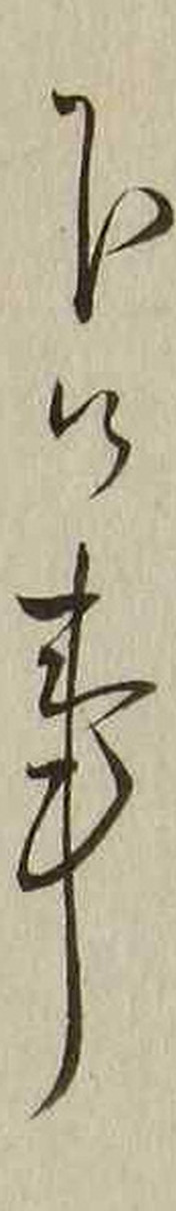下候事
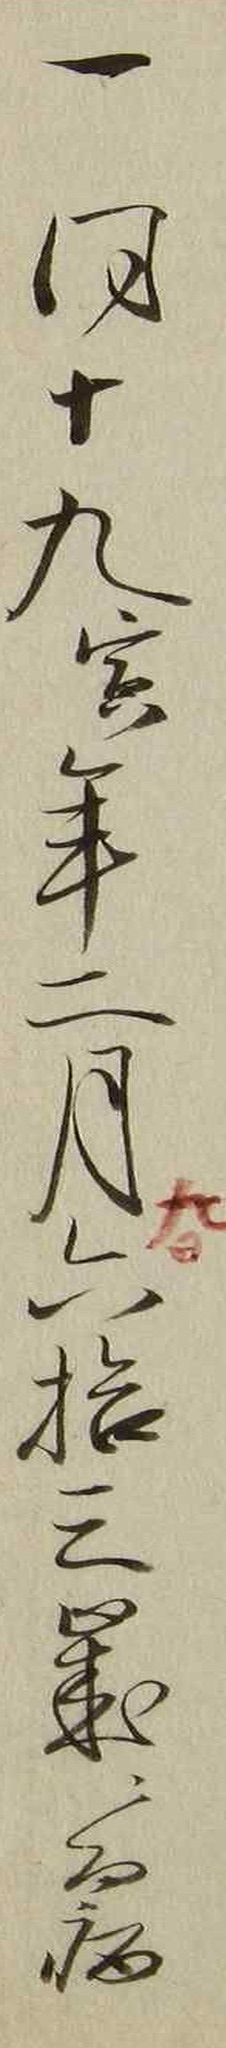一同十九寅年二月六拾三歳に而病
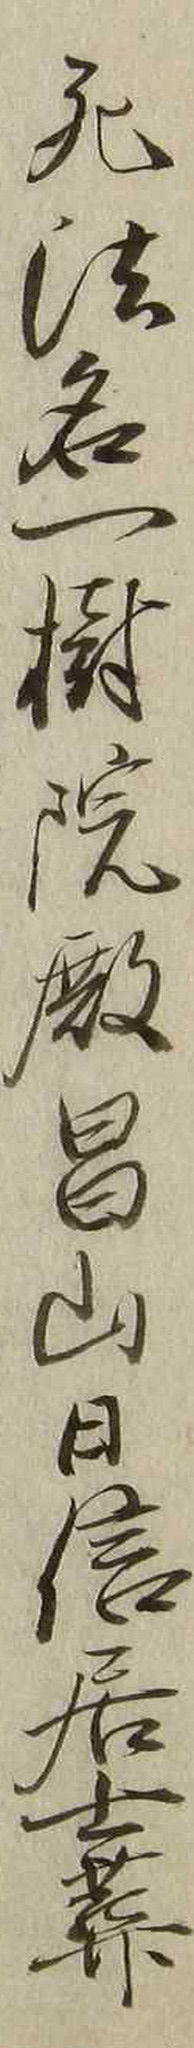死法名一樹院殿昌山日信居士葬
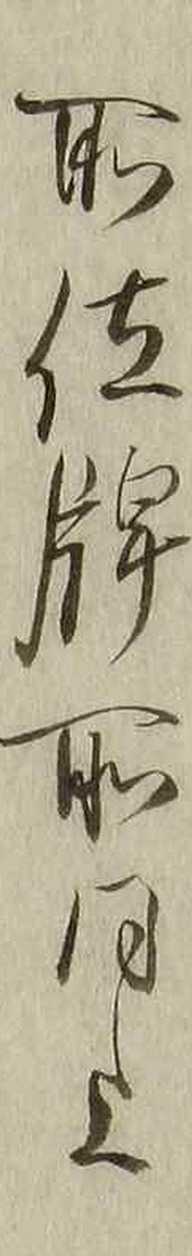所位牌所同上
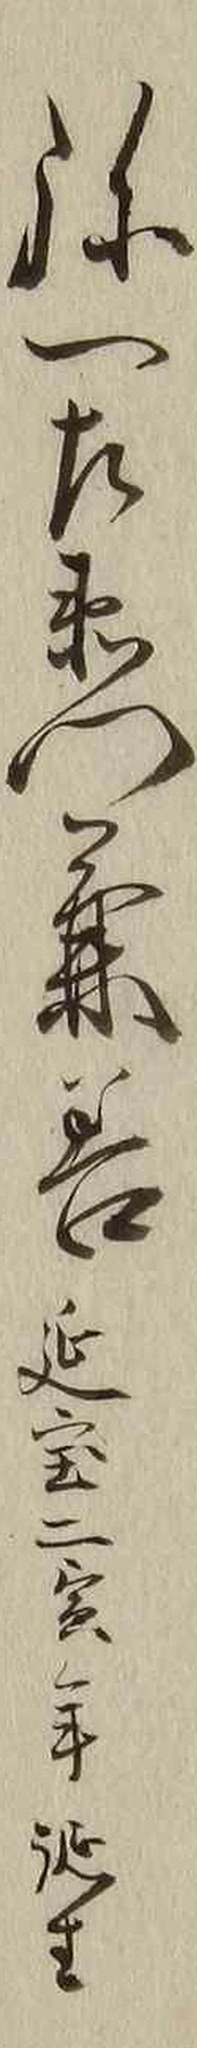弥一左衛門兼善延宝二寅年誕生
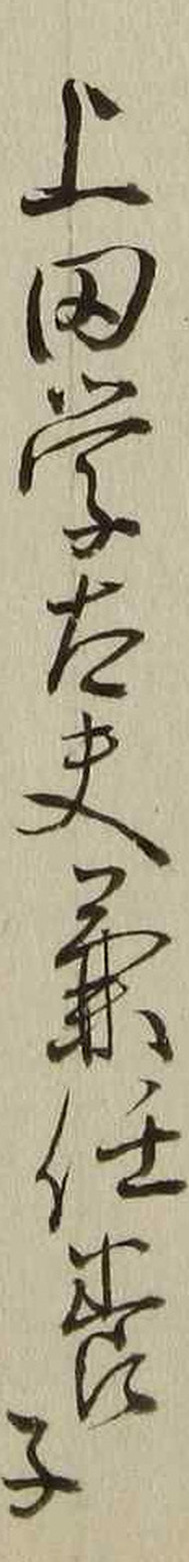上田学太夫兼任養子
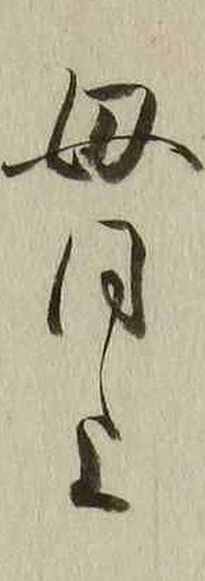母同上
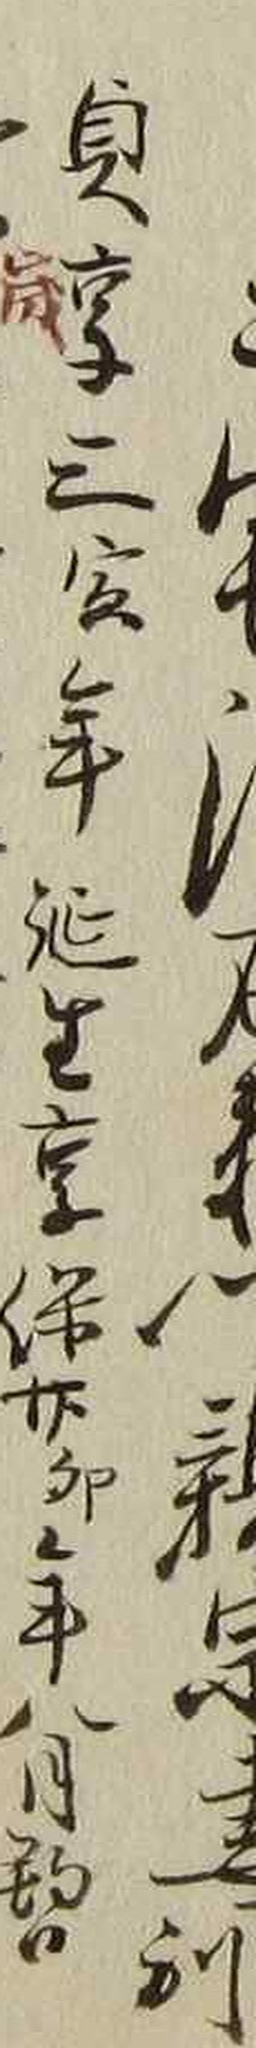貞享三寅年誕生享保廿卯年八月朔日
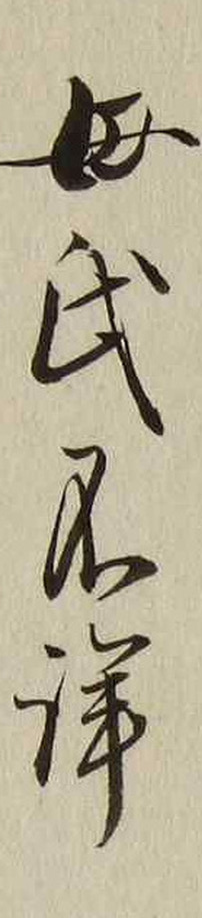母氏不詳
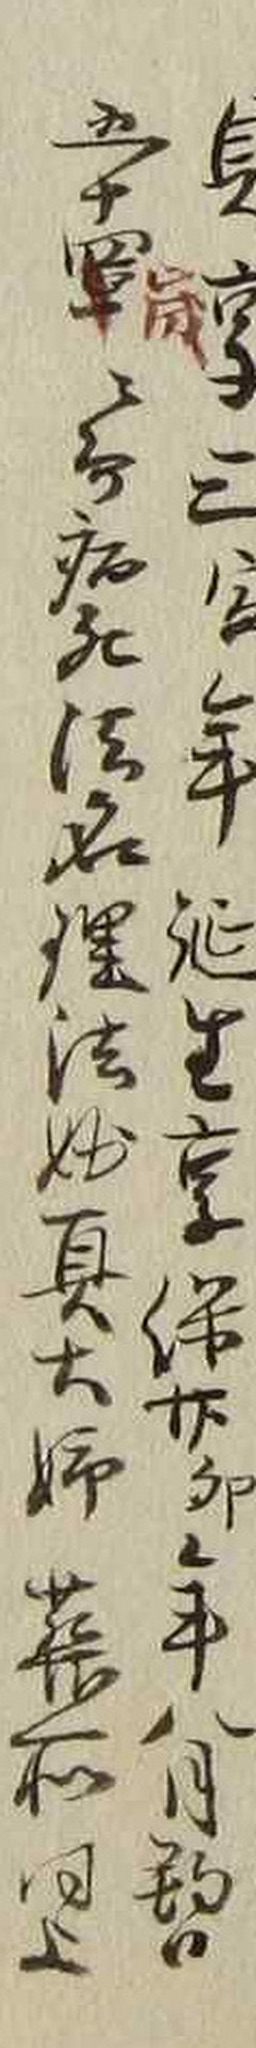五拾四歳に而病死法名理法妙真大姉葬所同上
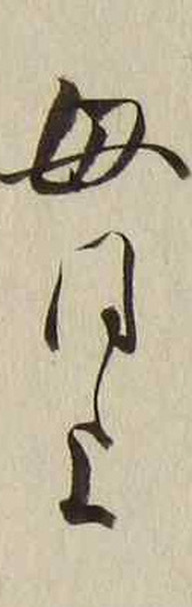母同上

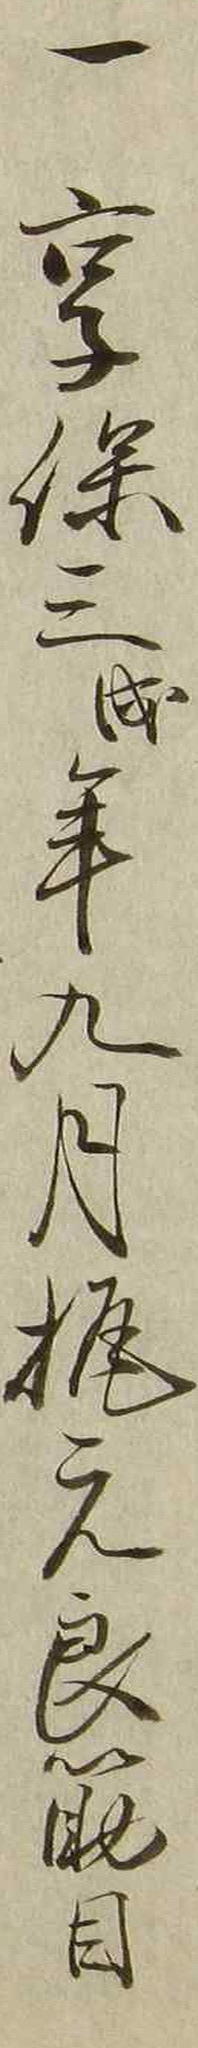一享保三戌年九月梶元良筋目
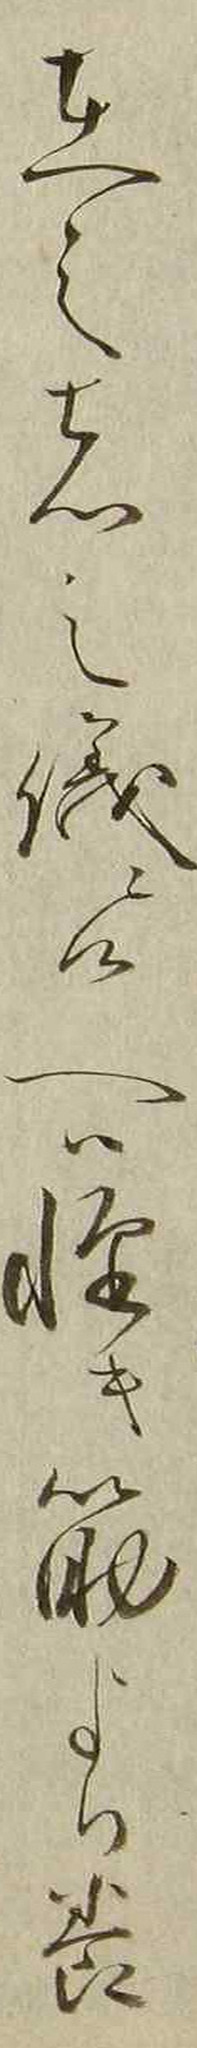在之者之儀に候へは軽き筋より養
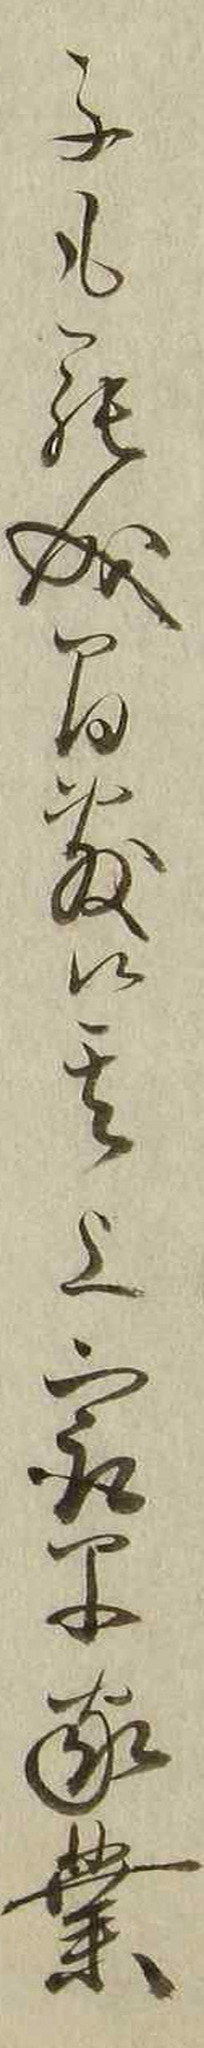子も罷成間敷候其上最早家業
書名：諸士系譜　巻之103　か之部11
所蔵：会津若松市立会津図書館
